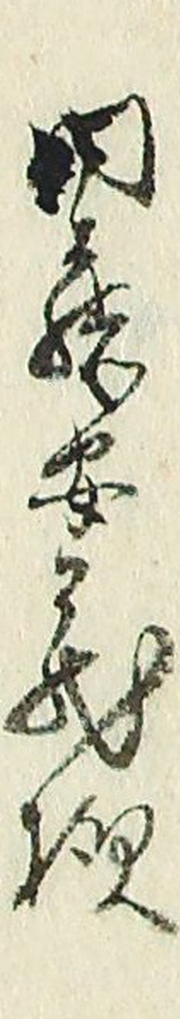内藤安蔵様
